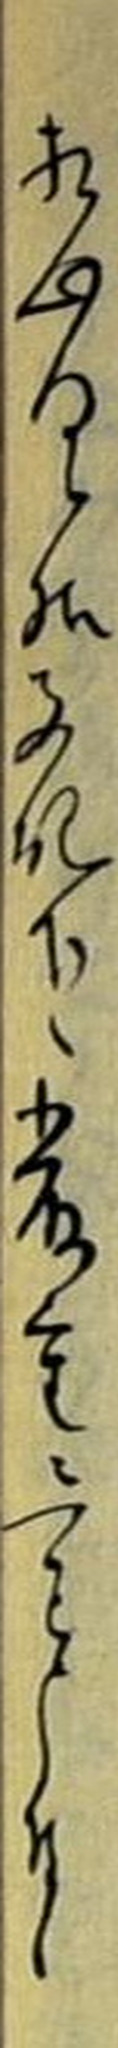相心得候様支配下へ厳重可申付候
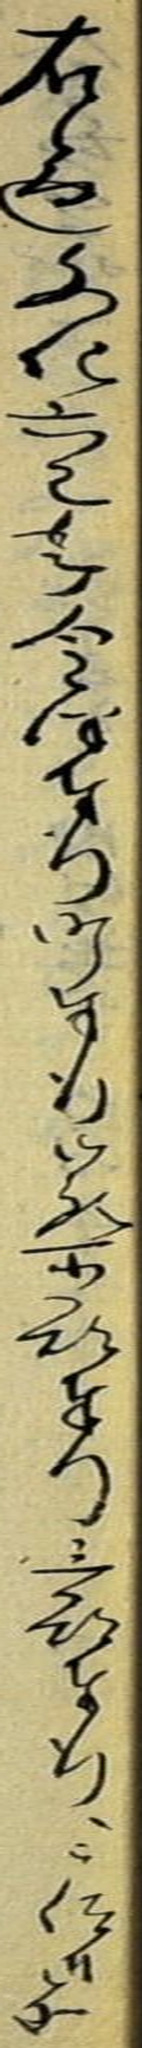右之通文化六巳年金津奉行町奉行御預所郡奉行三郡奉行へ被仰付候処
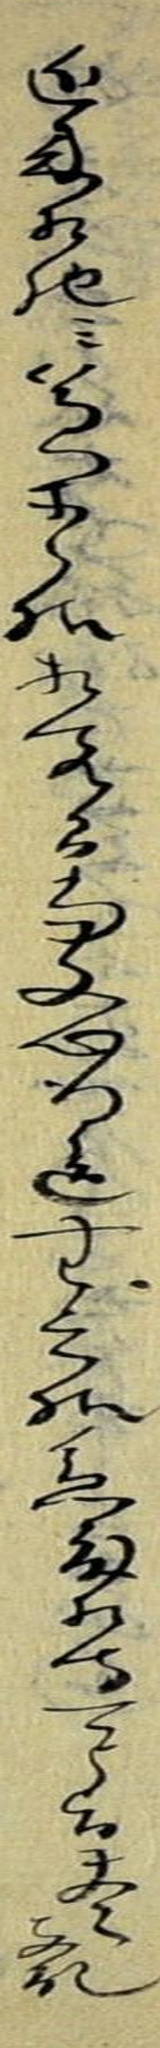近来相弛ミ等閑候様相聞候間尚又心得違無之様急度相守可申旨夫々支配
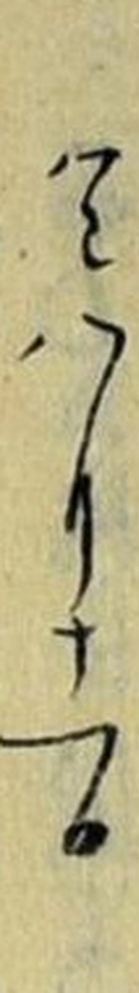閏八月十一日
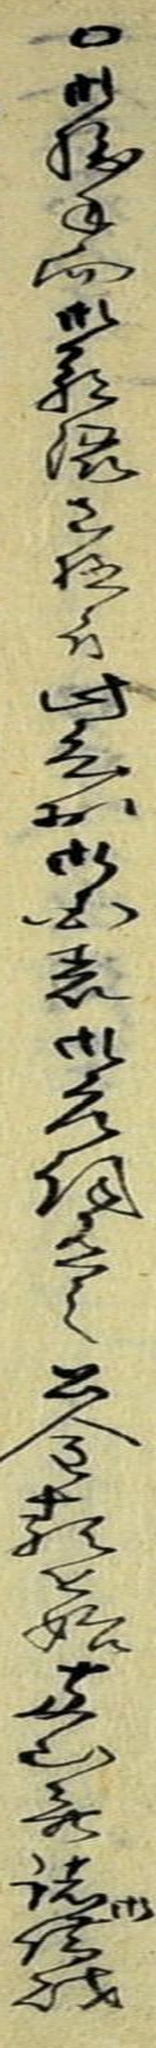○御勝手向御難渋至極に付此度於御国表御取調有之公金類を始両凶并諸御借財
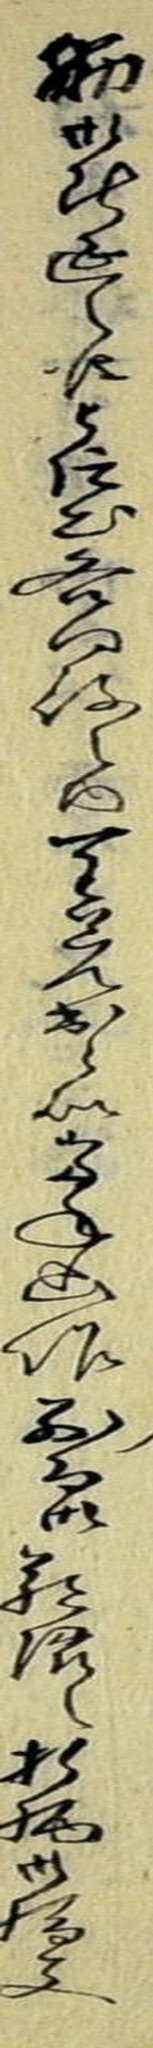筋御断延之儀被仰出各同役之内可差出候処当年凶作別而御難渋之折柄御指支
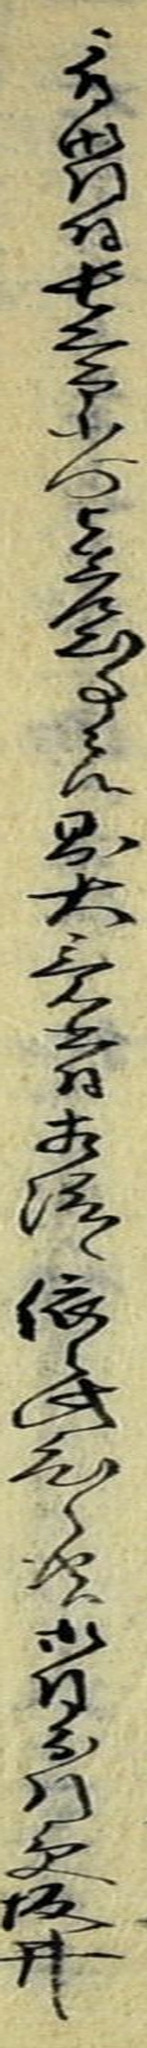に付御目付長谷部小右衛門被差出事に候則大意書付相渡候依之此度之儀は御自分引受坂井
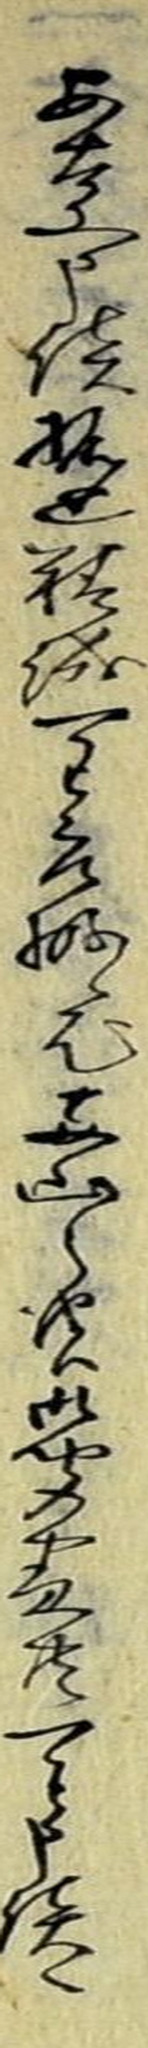安太夫申談振廻精誠可被取扱候尤両凶之儀は御聞番共可被申談候
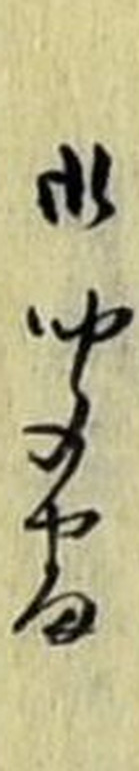御聞番
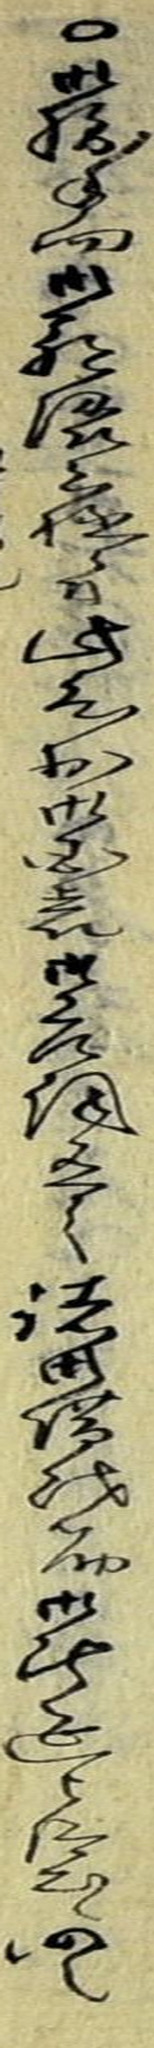○御勝手向御難渋至極に付此度於御国表御取調有之諸御借財筋御断延被仰出候仍之
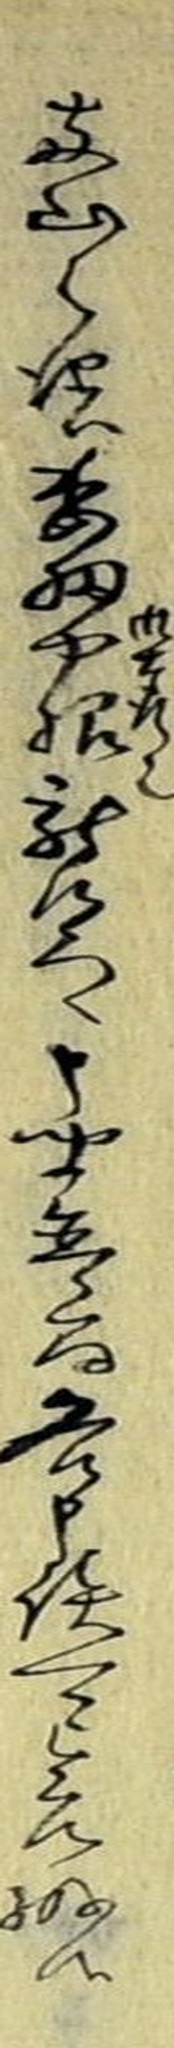両凶之儀は委細中根新左衛門御奉行也へ申聞置候間各申談可被取扱候
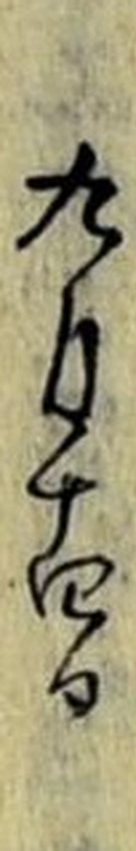九月十四日
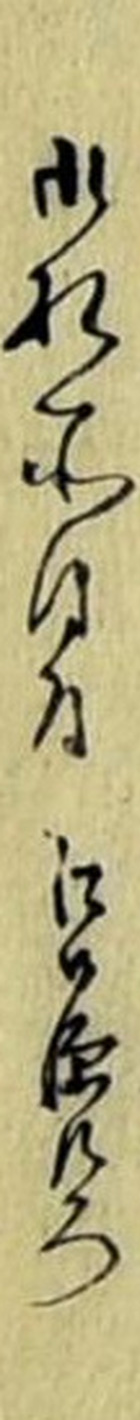御札所目付江口源左衛門

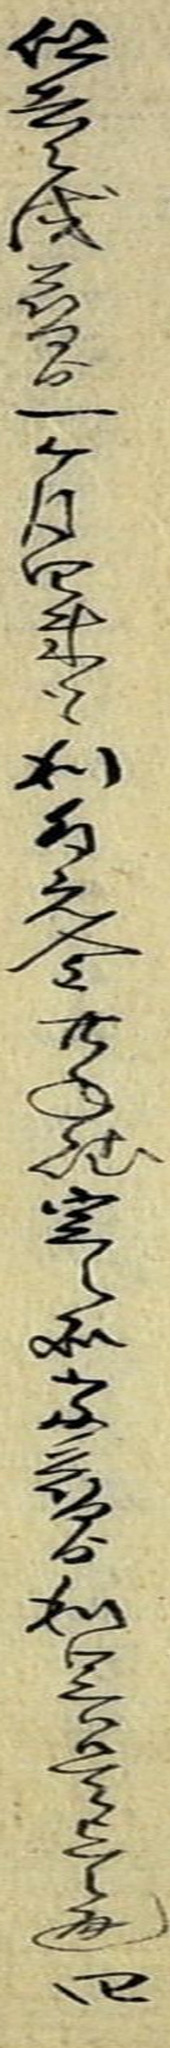但去々戌暮ゟ一ヶ月四朱つヽ利付元金廿年賦定之処当暮ゟ利足は是迄之通四
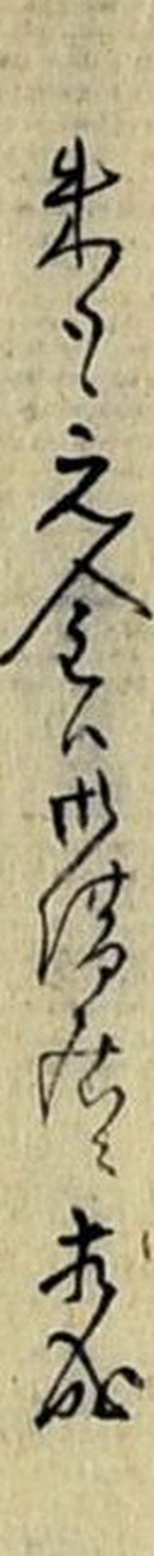朱つヽ元金は御借居に相成
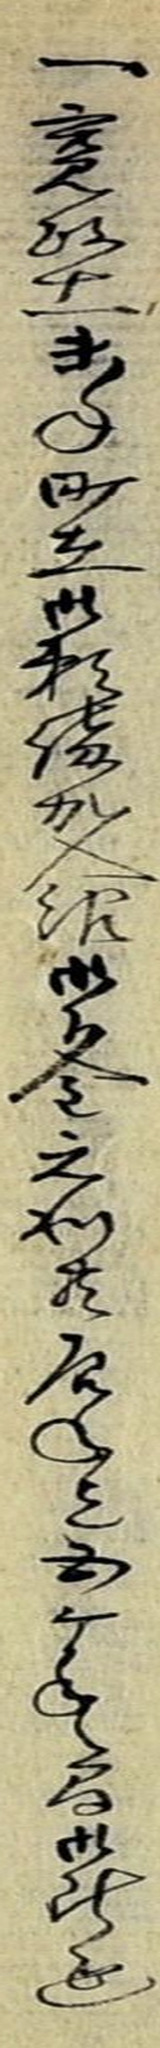一寛政十一未年町在御頼講加入銀御下金元利共辰年迄五ヶ年之間御断延
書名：命令之部 四
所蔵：福井県文書館 Fukui Prefectural Archives
